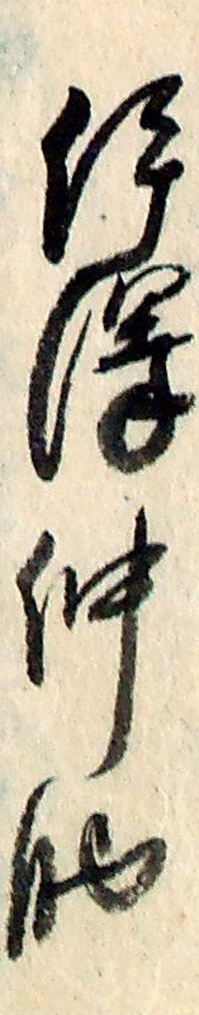伊沢仲助
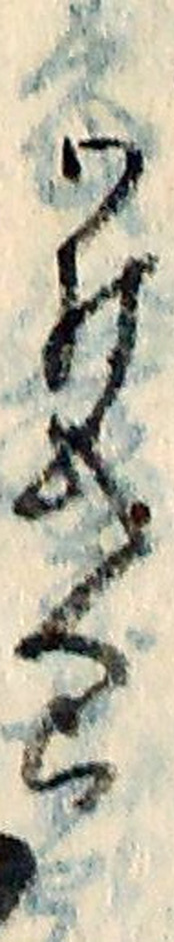同村五人与
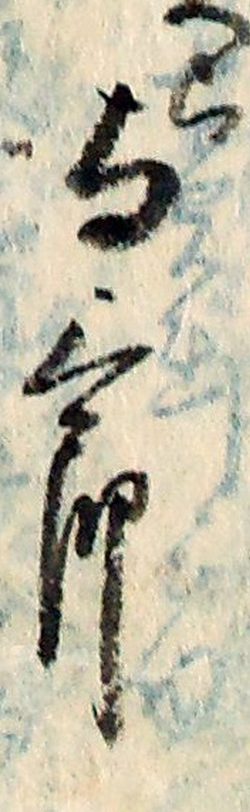与三郎
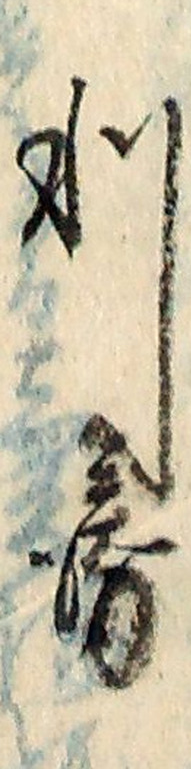利兵衛
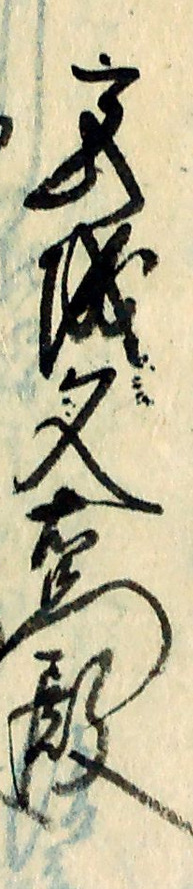宮城文右衛門殿
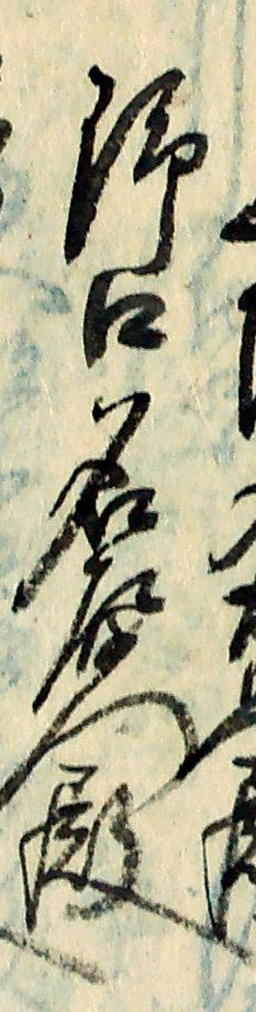野口名左衛門殿
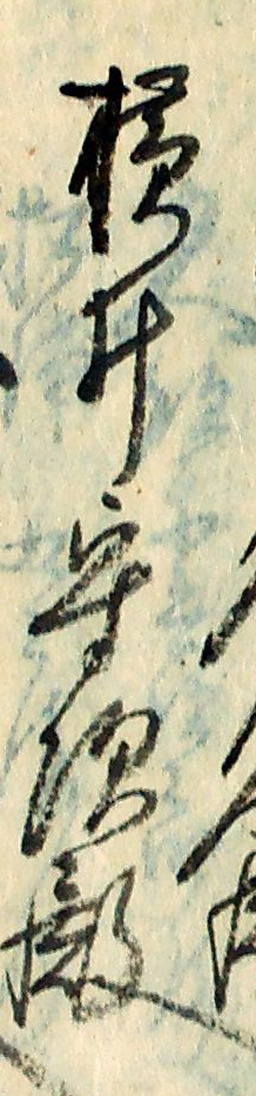横井守次殿
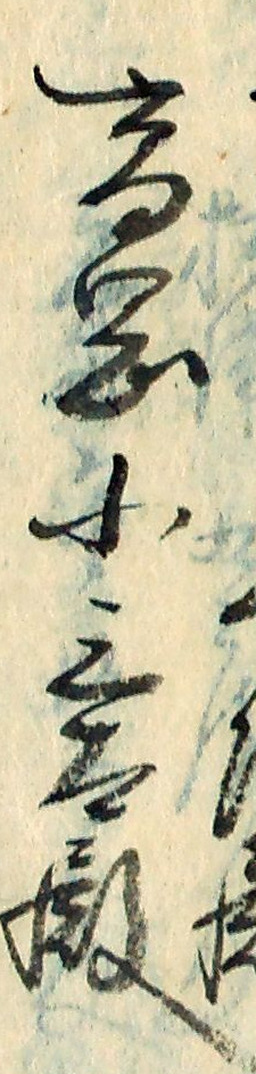高岡小三太殿

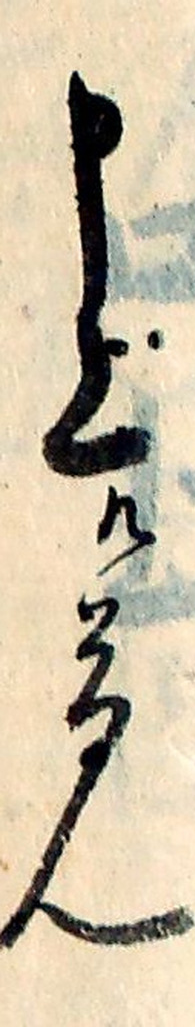申上候覚
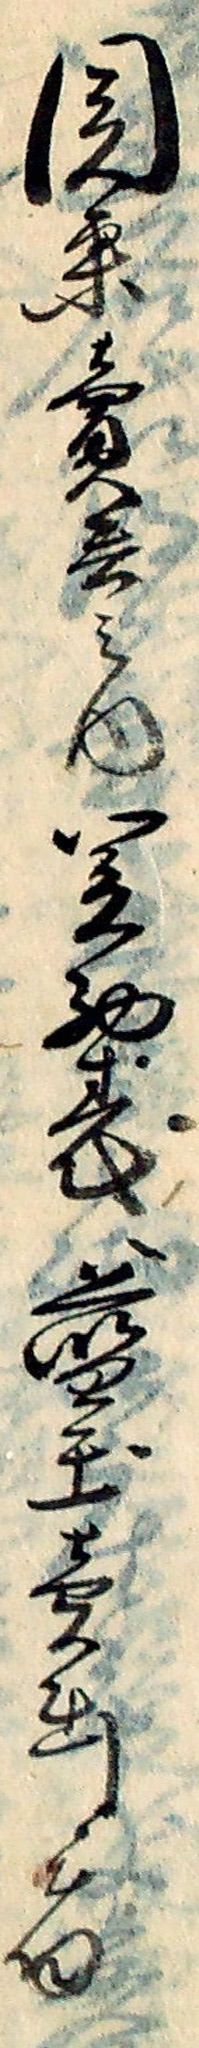関東商売之内関西表へ藍玉売出し候者
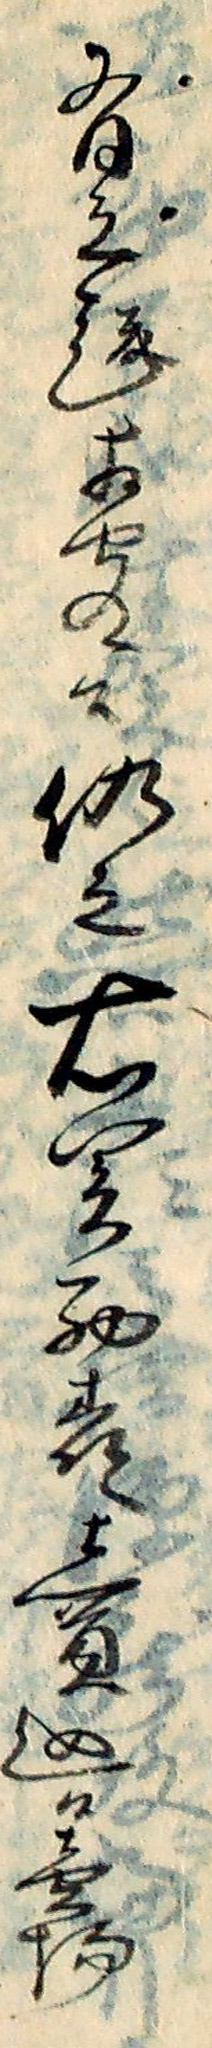有之趣相聞へ候仍之右関西表へ売込候売場
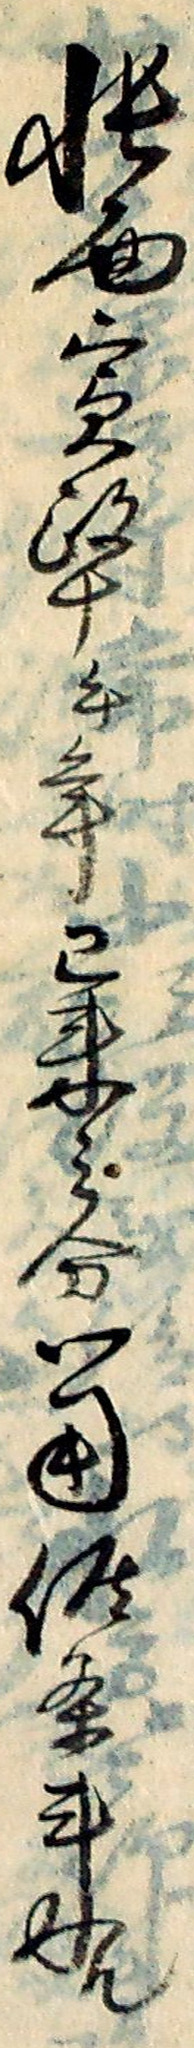帳面寛政十午年已来之分御用候条来る
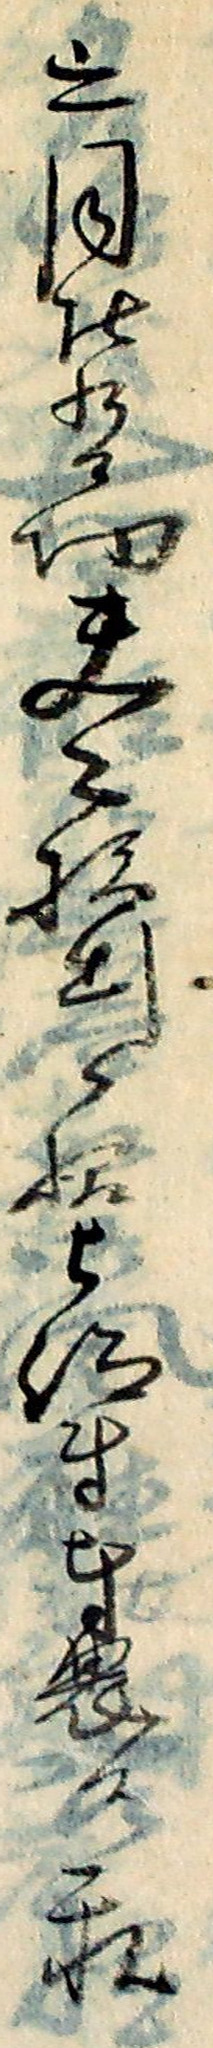六月廿九日切夫々指出し候様被仰付奉畏候私
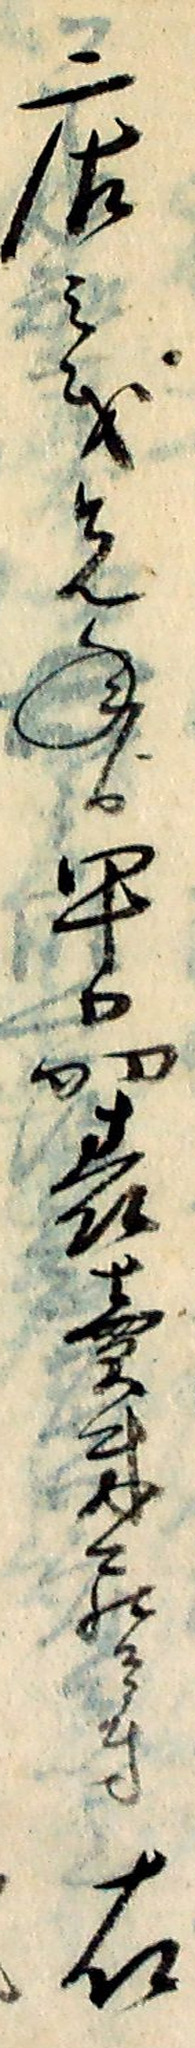店之義先年ゟ甲州表売来居候に付右
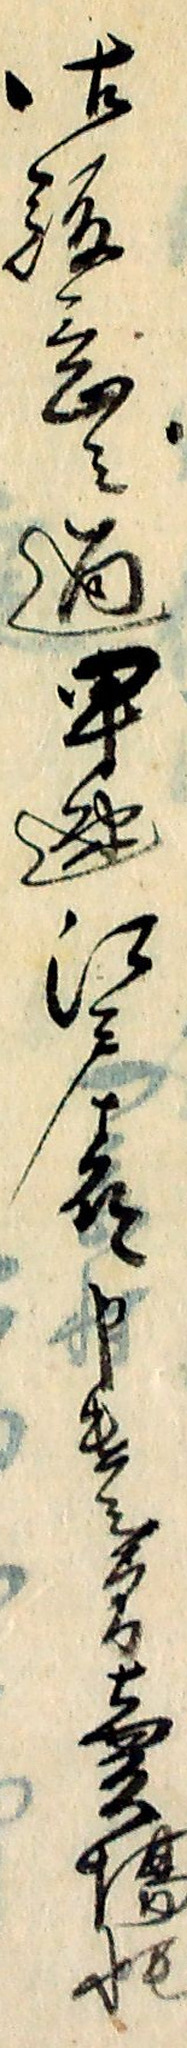御趣意之通早速江戸表へ申遣し候間売場帳
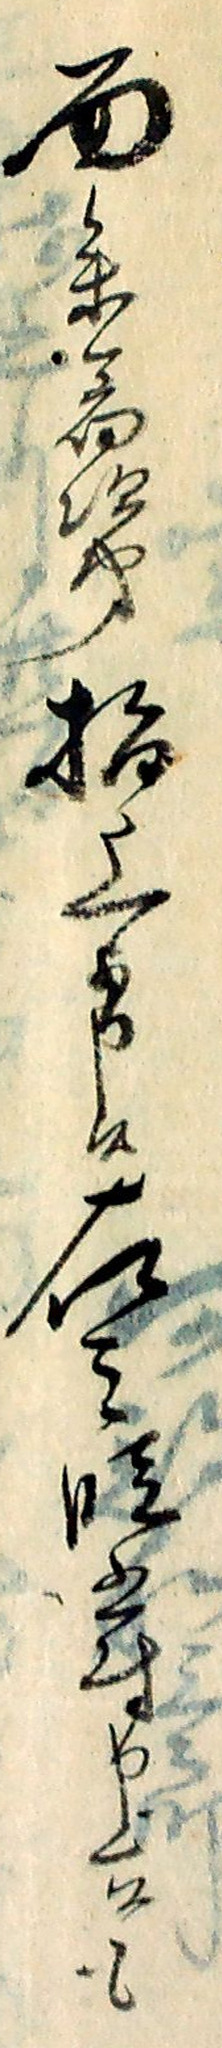面参着次第指上可申候右之段書付申上候以上
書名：諸御願書控(後藤氏壱番）
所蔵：鳴門教育大学 Naruto University of Education
